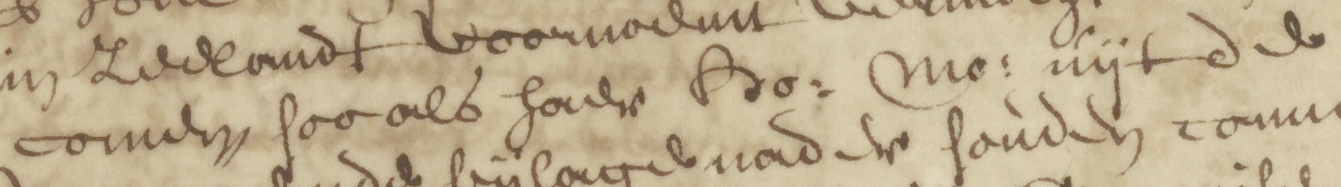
comen, soo als haer Ho:Mo: uijt de
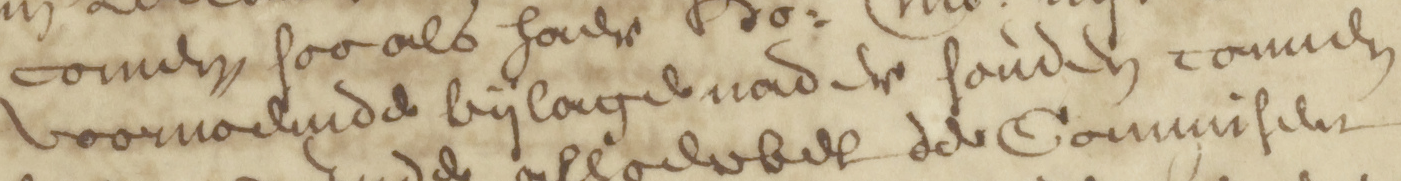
voornoemde bijlage nader souden connen
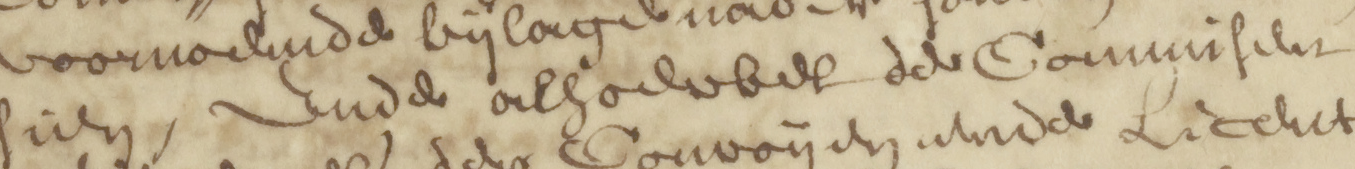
sien. Ende alhoewel de Commisen
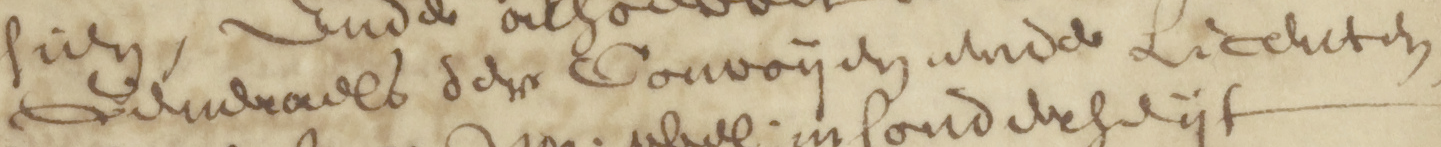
Generaels der Convoijen ende Licenten,
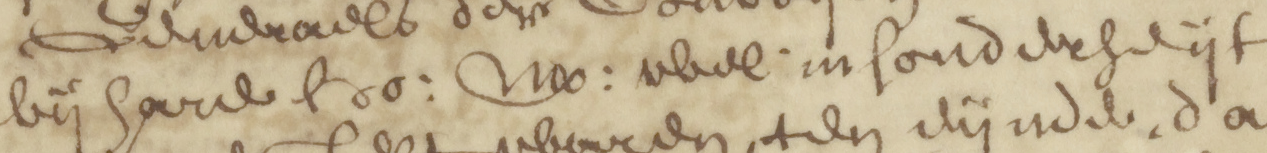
bij hare Ho:Mo: wel insonderheijt
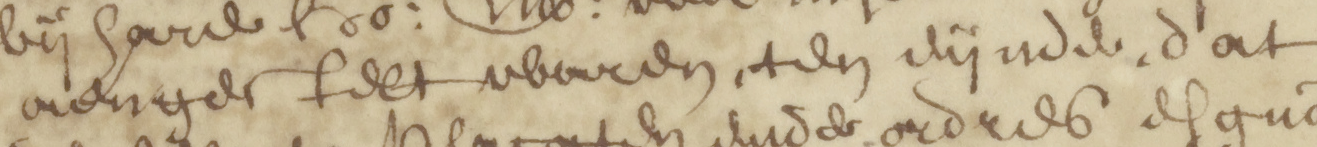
aengestelt waren, ten eijnde, dat
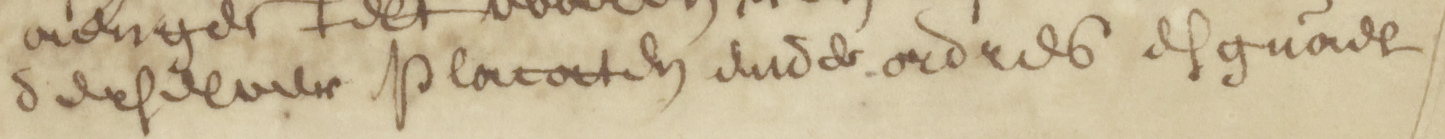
derselver Placaten ende ordres esquael
